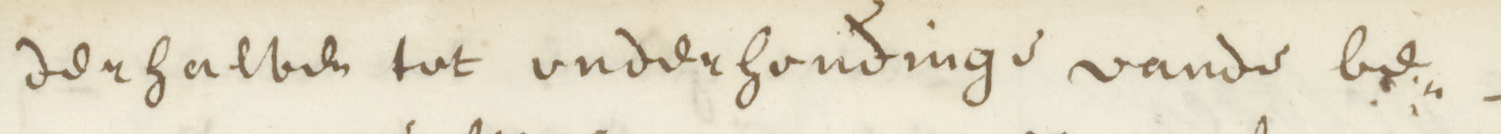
derhalven tot onderhoudinge vande be„
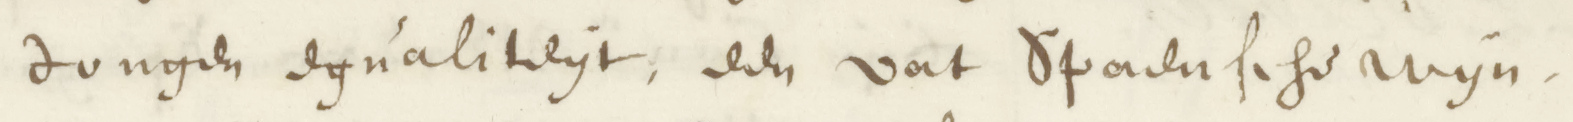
dongen egualiteijt, een vat Spaensche wijn,
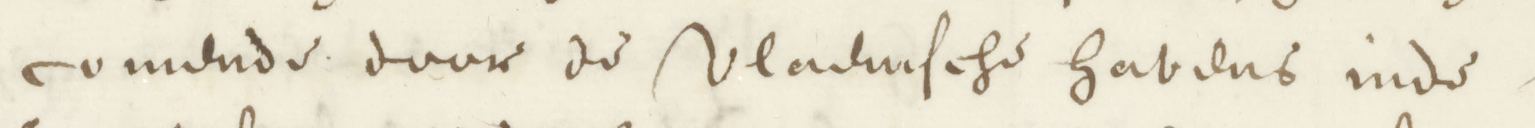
comende door de Vlaemsche havens inde
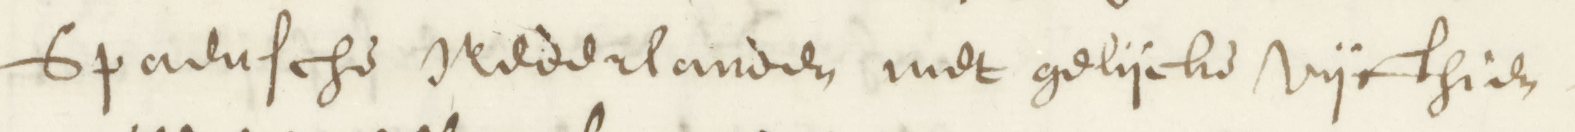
Spaensche Nederlanden met gelijcke vijfthien
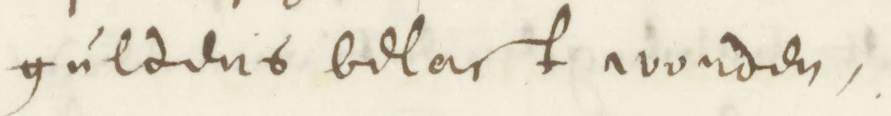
guldens belast worden.
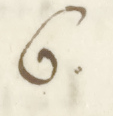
6.
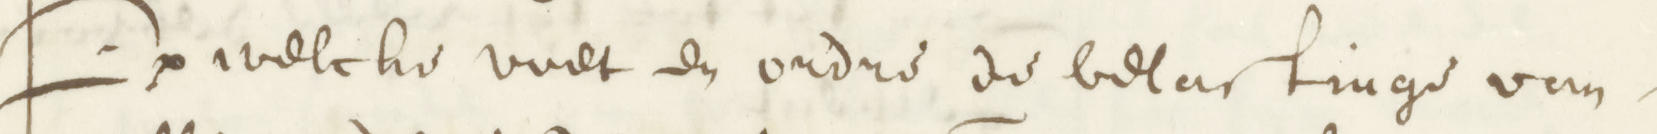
Op welcke voet en ordre de belastinge van
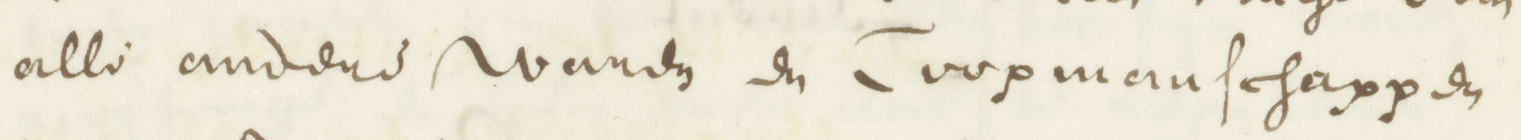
alle andere waren en Coopmanschappen
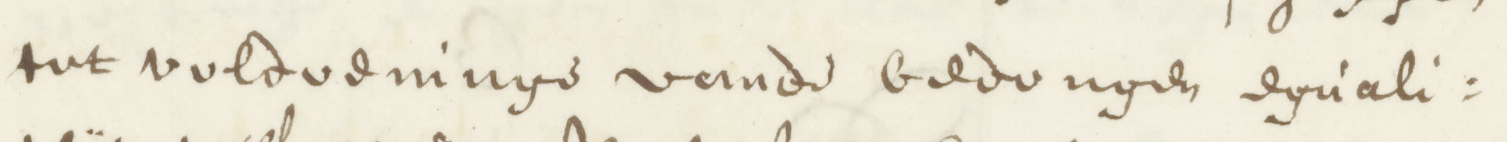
tot voldoeninge vande bedongen eguali:
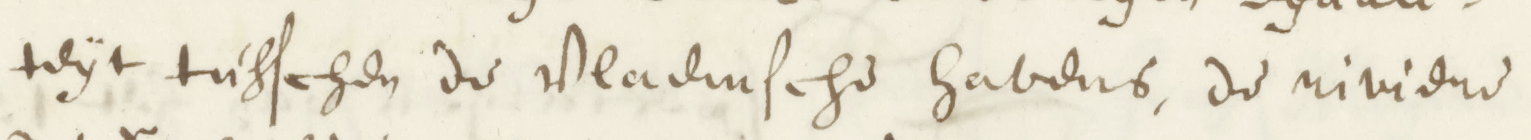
teijt tusschen de Vlaemsche havens, de riviere
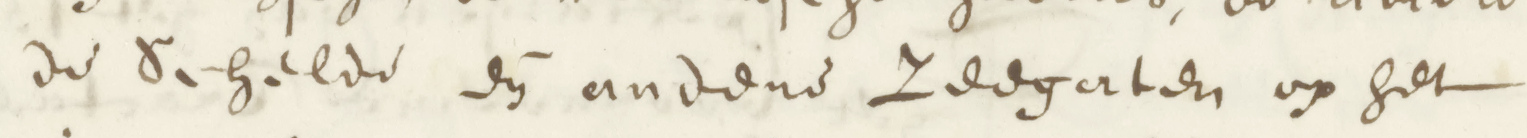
de Schelde en andere Zeegaten op het
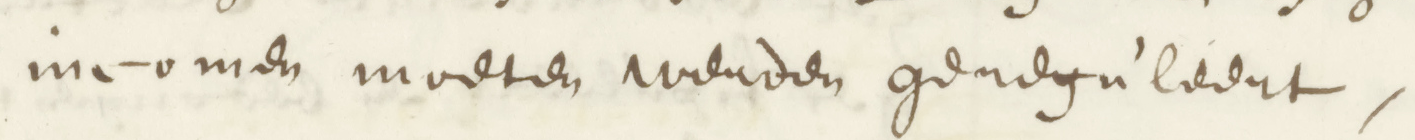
incomen moeten werden gereguleert.
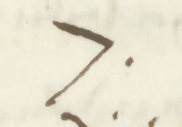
7.
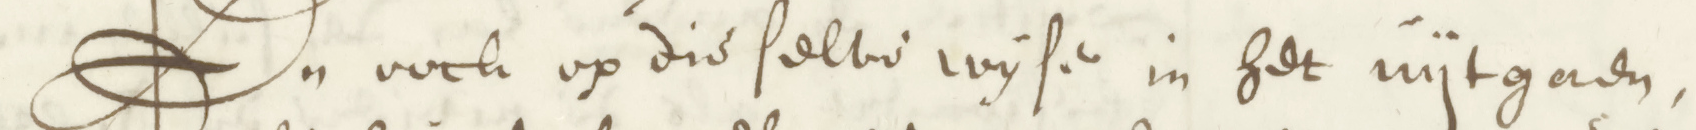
En oock op die selve wijse in het uijtgaen,
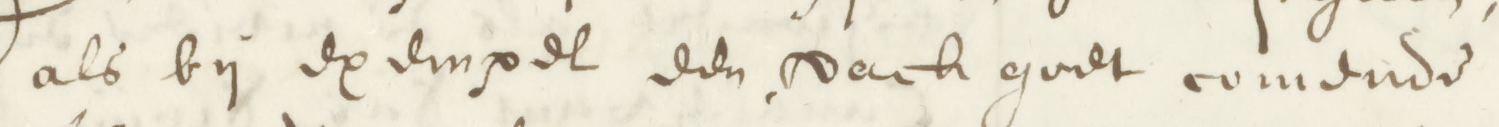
als bij exempel een pack goet comende
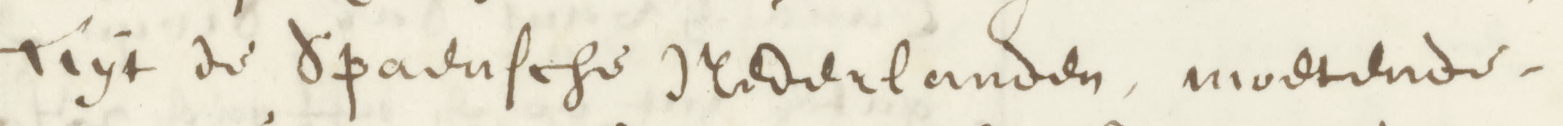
Uijt de Spaensche Nederlanden, moetende
